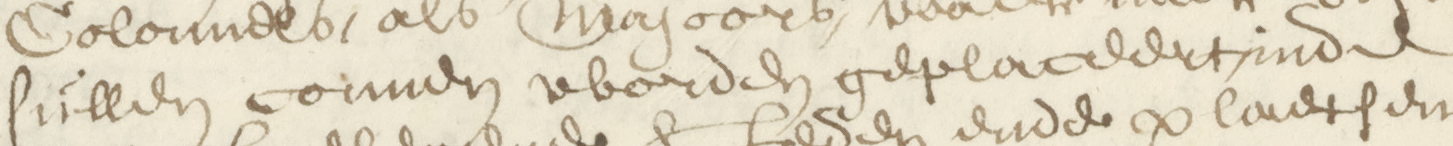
sullen connen worden geplaceert inde
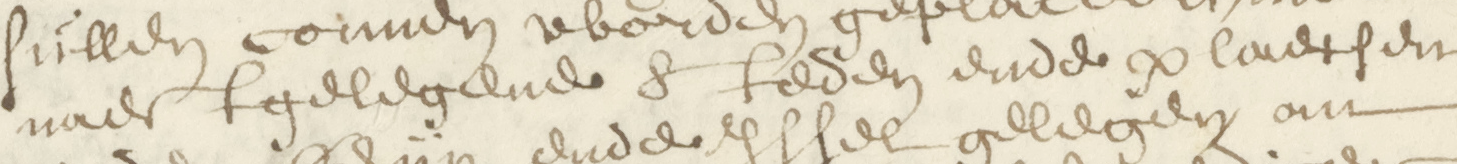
naestgelegene Steden ende plaetsen
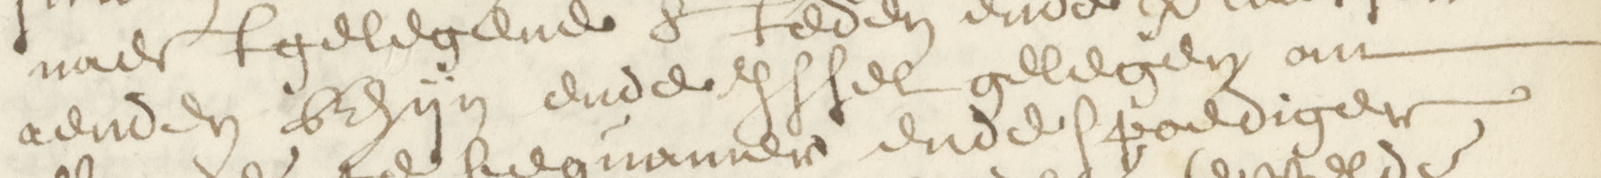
aenden Rhijn ende Issel gelegen om
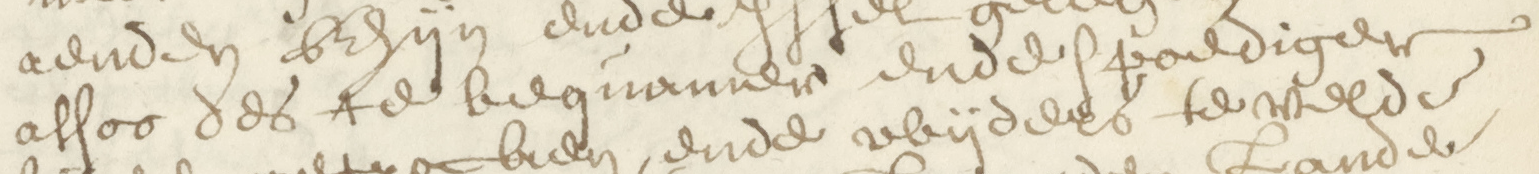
alsoo des te bequamer ende spoediger
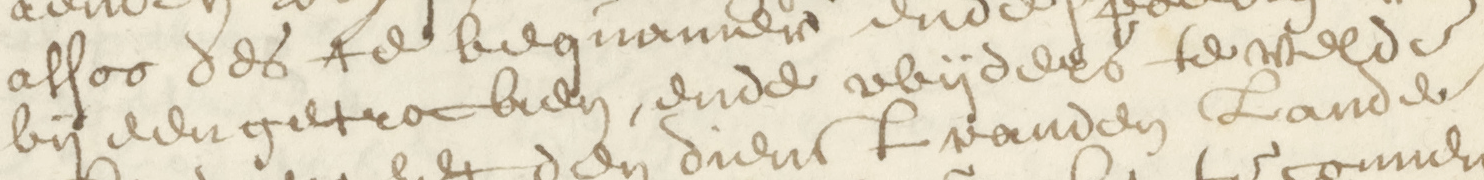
bij een getrocken, ende wijders te velde
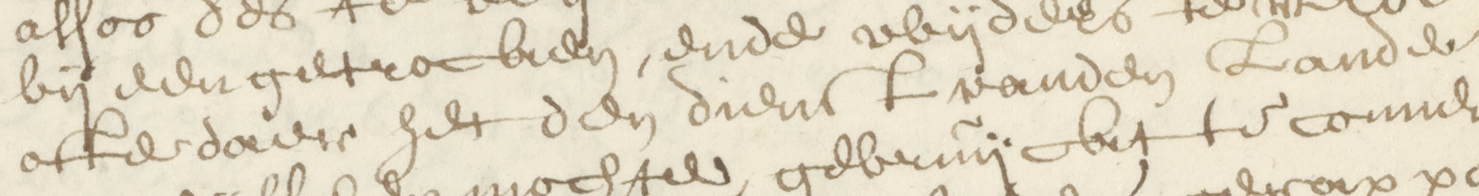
ofte daer het den dienst vanden Lande
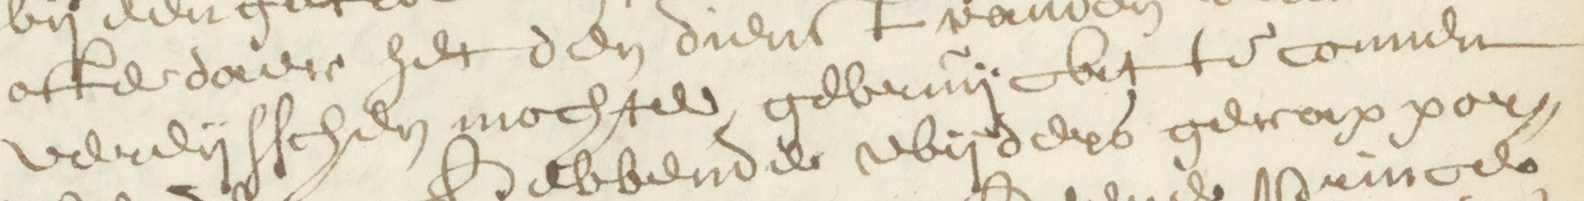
vereijsschen mochte gebruijckt te connen
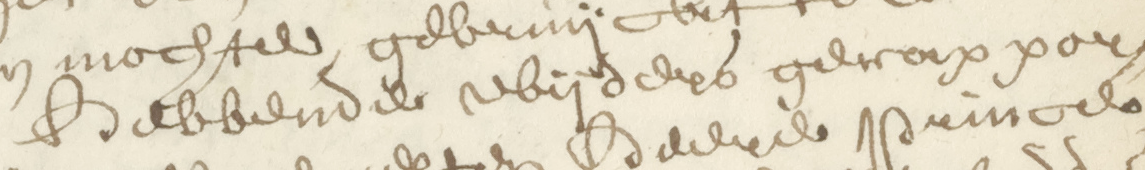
werden, hebbende wijders gerappor„
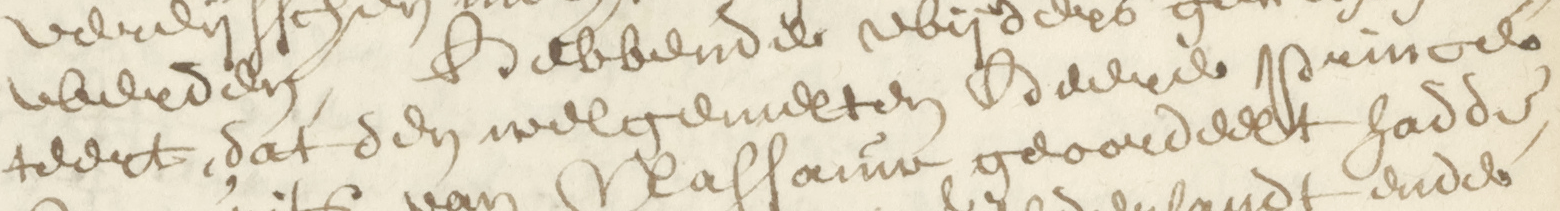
teert, dat den welgemelten Heere Prince
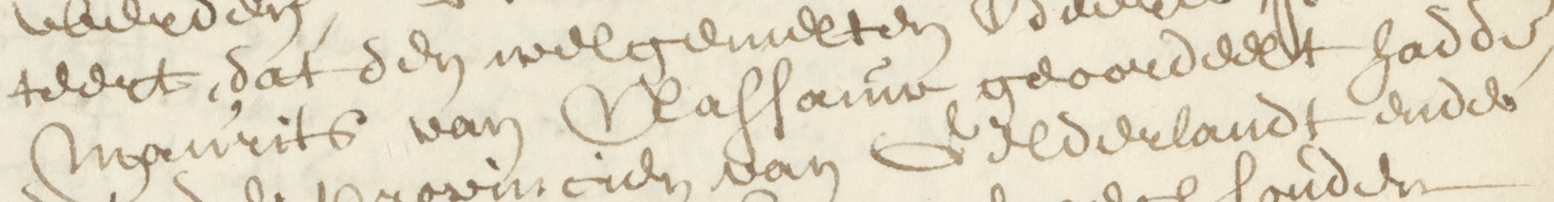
Maurits van Nassauw geoordeelt hadde,
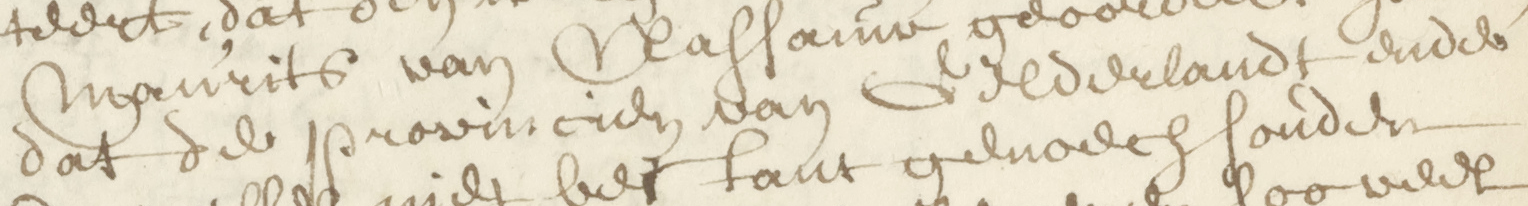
dat de Provincien van Gelderlandt ende
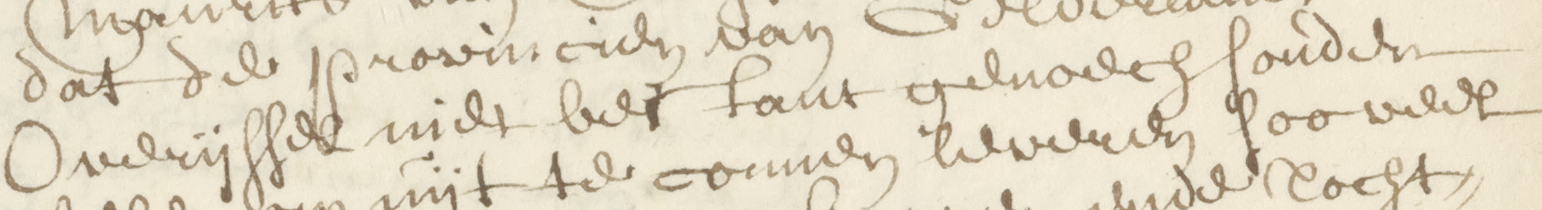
Overijssel niet bestant genoech souden
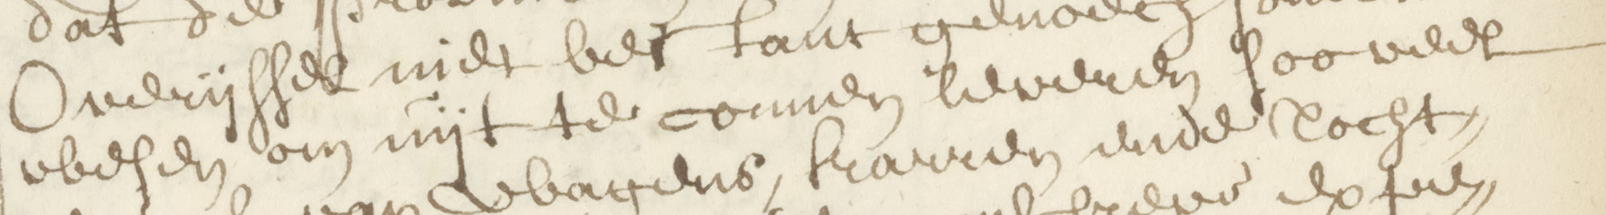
wesen om uijt te connen leveren soo veel
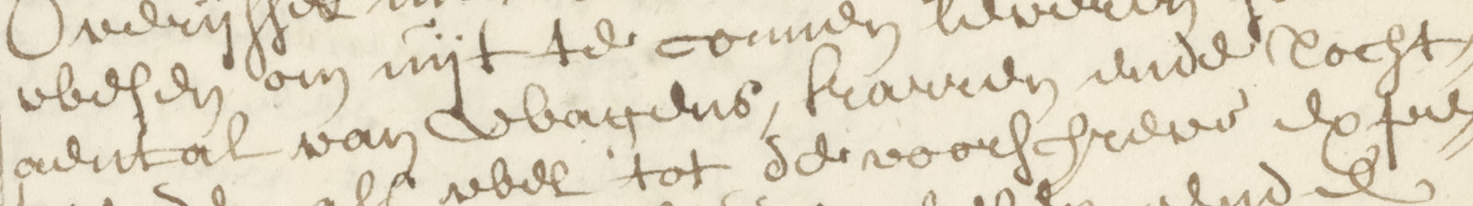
aental van Wagens, karren ende Tocht„
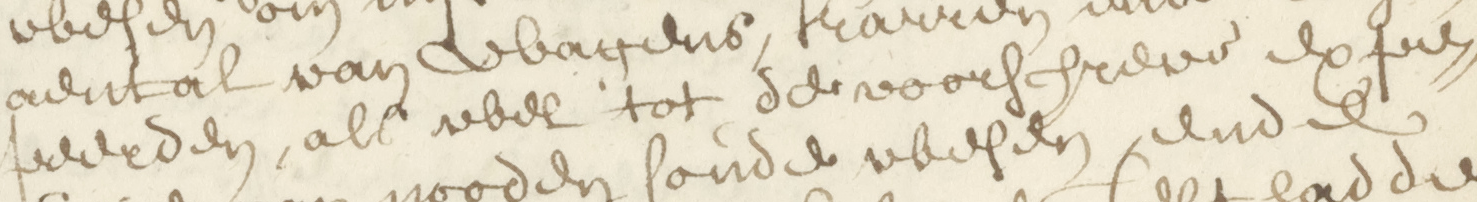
peerden, als wel tot de voorschreve expe„
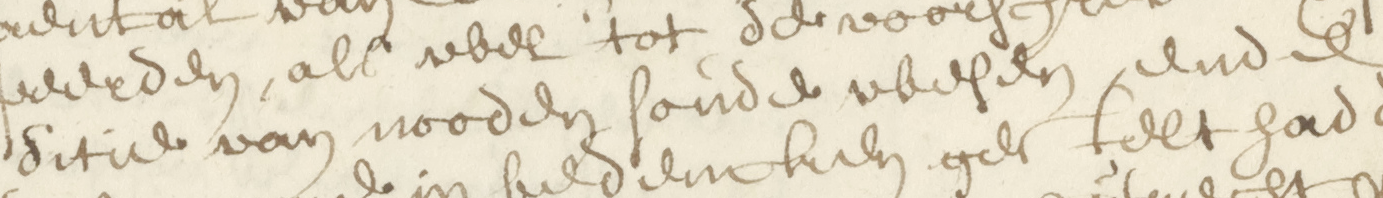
ditie van nooden soude wesen, ende
